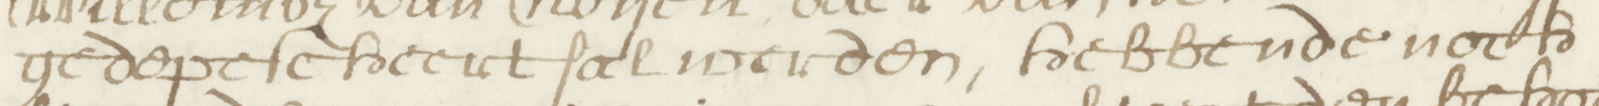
gedepescheert sal werden, hebbende noch
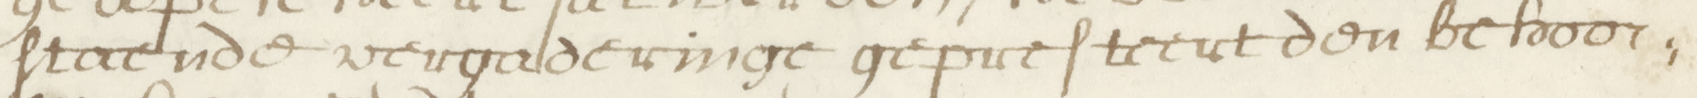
staende vergaderinge gepresenteert den behoor,,
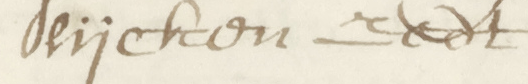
lijcken Eedt.
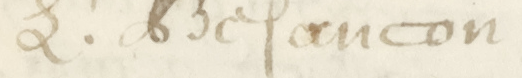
Lt. Besancon
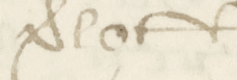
vloff
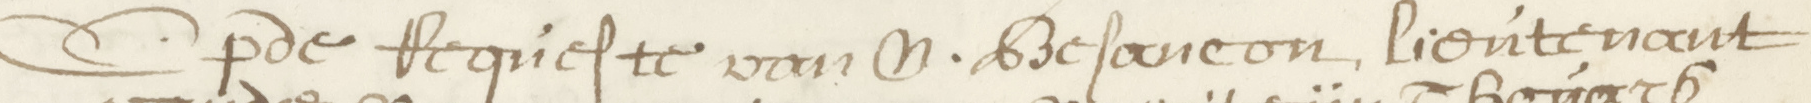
Opde Requeste van N. Besancon, lieutenant
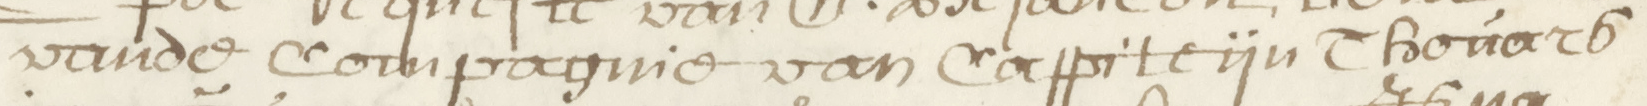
vande Compagnie van Cappiteijn Thouars
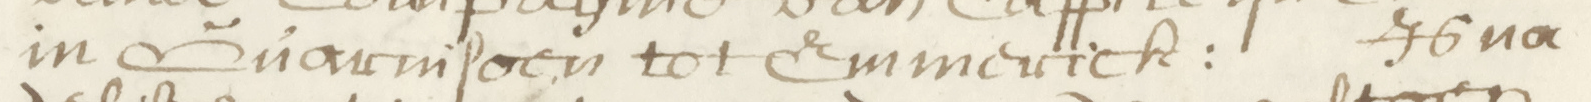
in Guarnisoen tot Emmerick: Is na
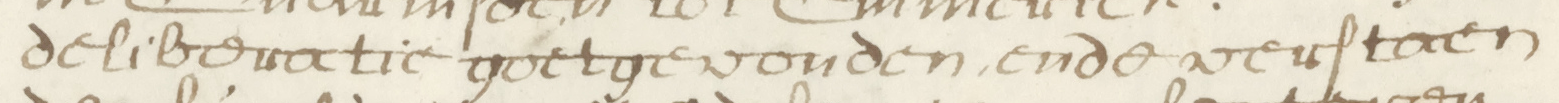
deliberatie goetgevonden, ende verstaen,
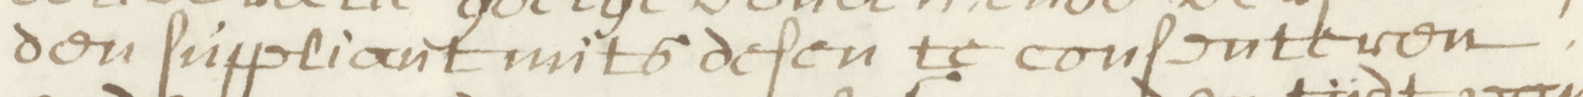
den suppliant mits desen te consenteren,
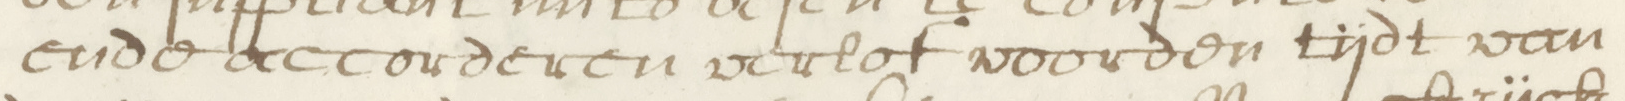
ende accorderen verlof voorden tijdt van
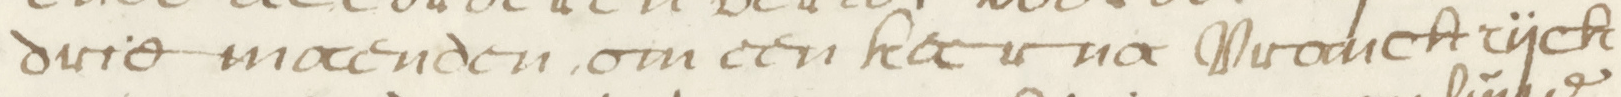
drie maenden, om een keer na Vranckrijck
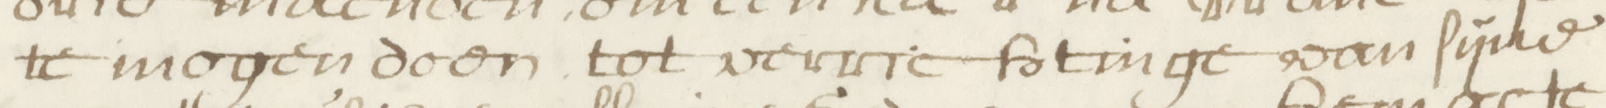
te mogen doen tot verrichtinge van sijne
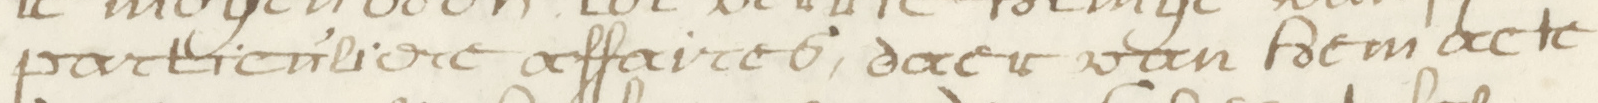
particuliere affaires, daer van hem acte
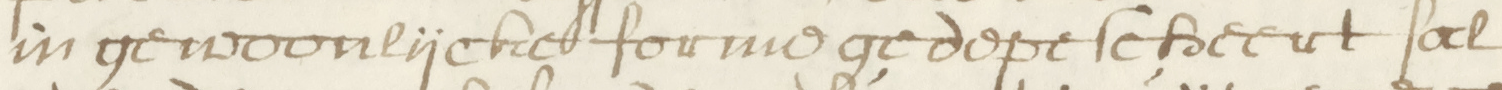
in gewoonlijcke forme gedepescheert sal
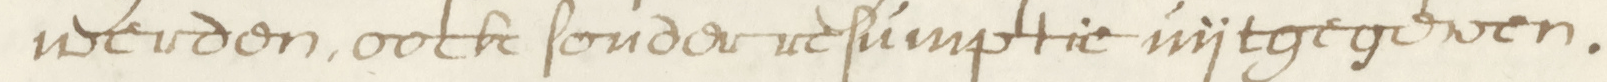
werden, oock sonder resumptie uijtgegeven.
